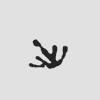出
